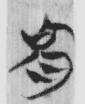肙
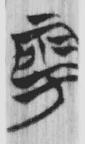𩁹
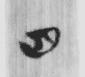四
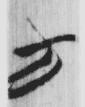方
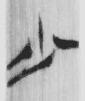少
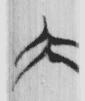大
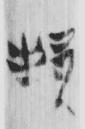邦
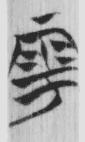𩁹
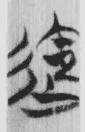御
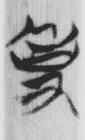事
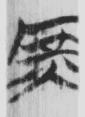庶
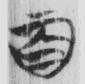百
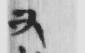又
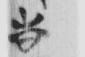告
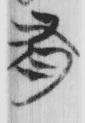有
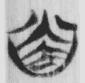{火自}
